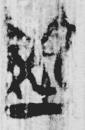○（地）
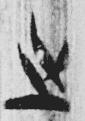之
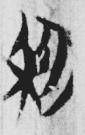利（利）
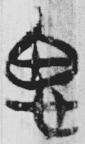思
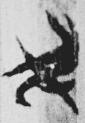民
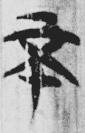不
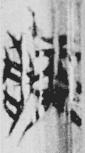疾
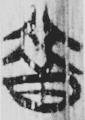昔
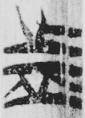者
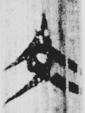文
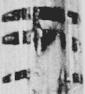王
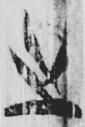之
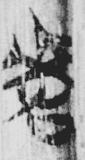差（佐）
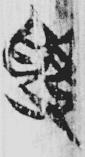受（紂）
